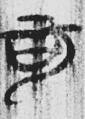可（奇）
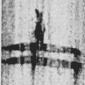士
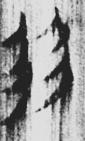○（御）
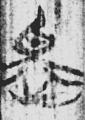○（卒）
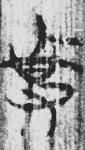史（使）
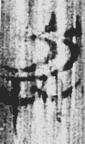兵
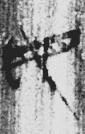母
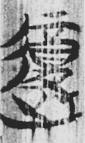○（復）
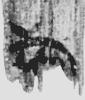○（失）
